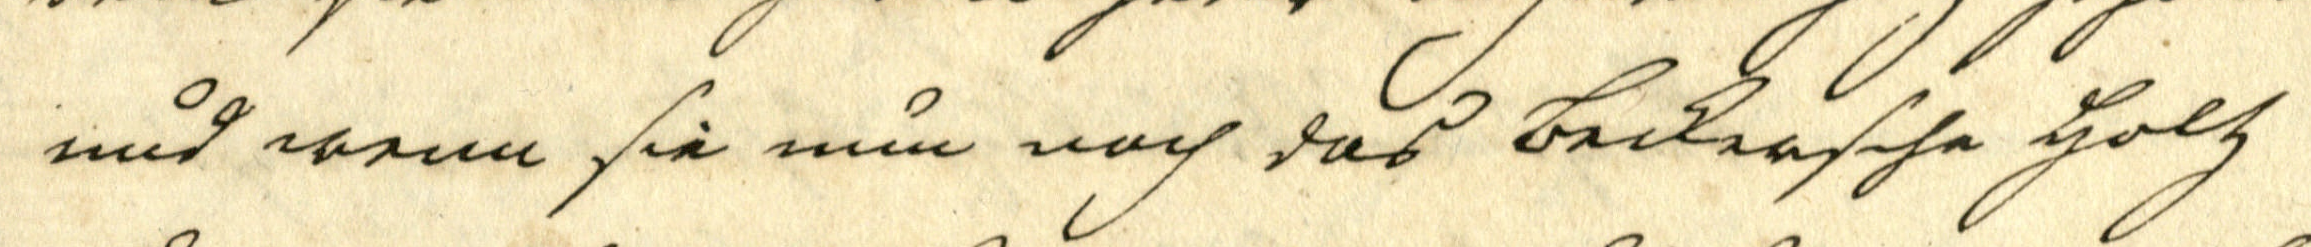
und wenn sie nun noch das Beckersche Holz
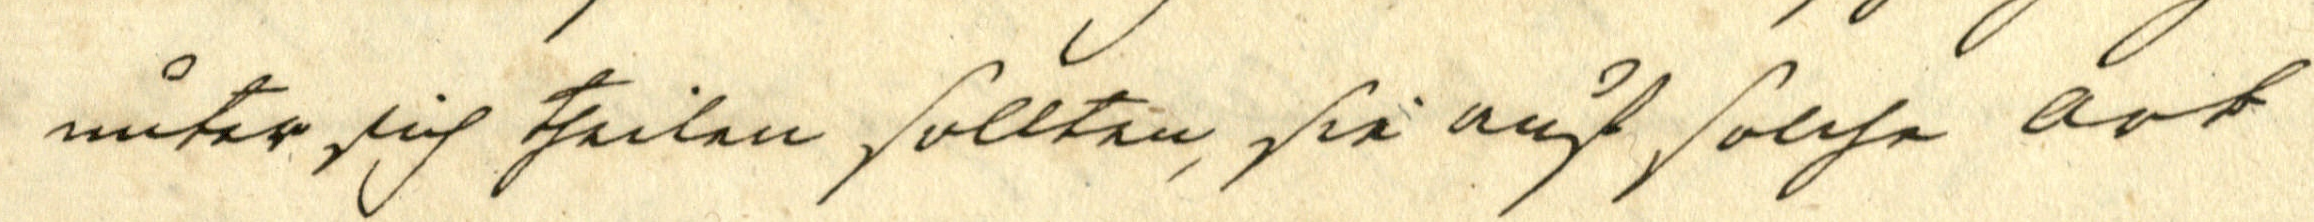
unter sich theilen sollten, sie auf solche Art
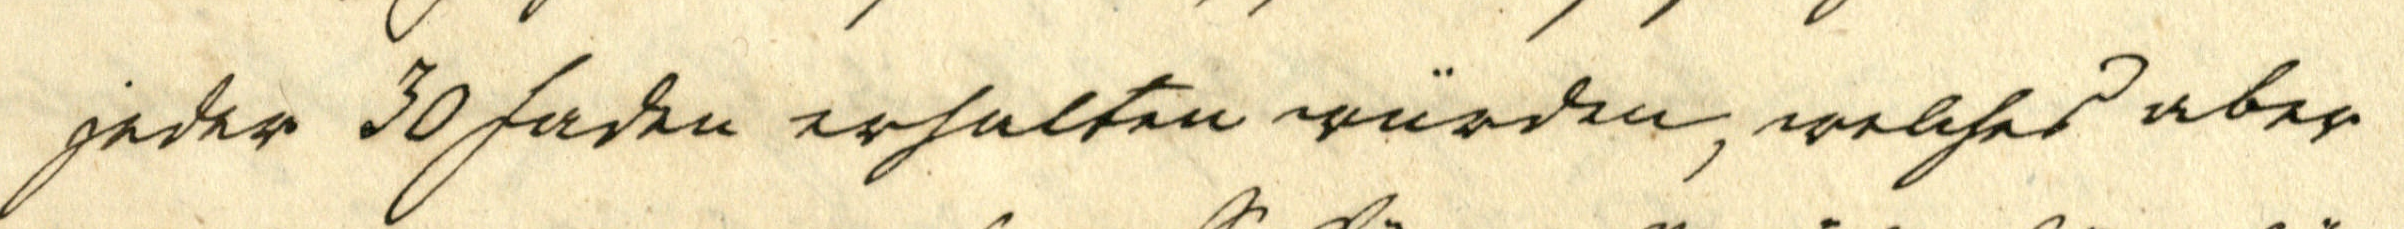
jeder 30 Faden erhalten würden, welches aber
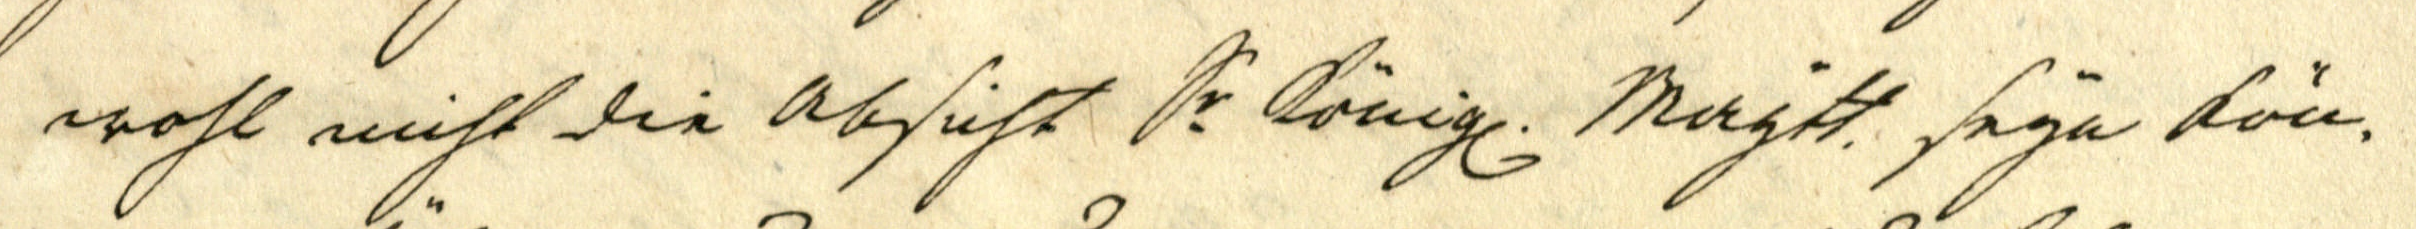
wohl nicht die Absicht Sr. Königl. Maÿtt. seÿn kön¬
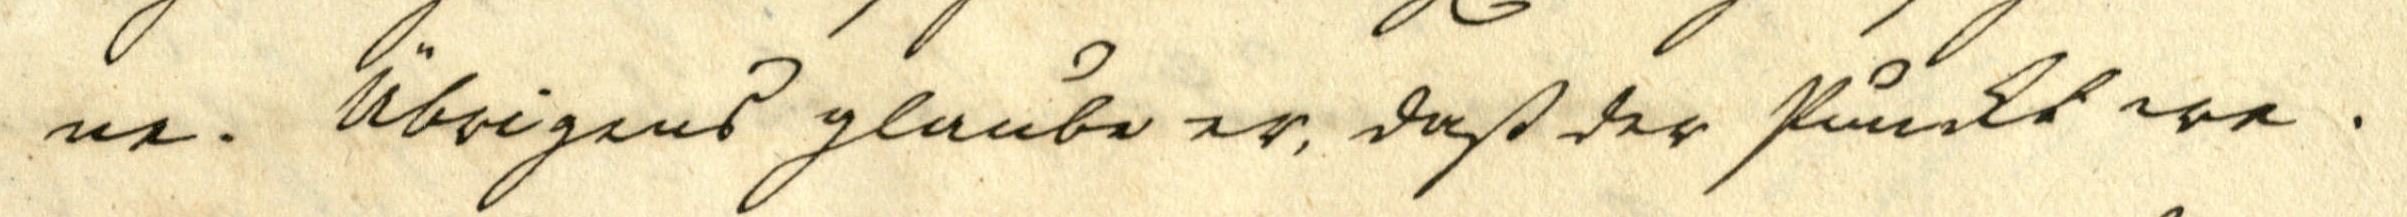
ne. Übrigens glaube er, daß der Punckt we¬
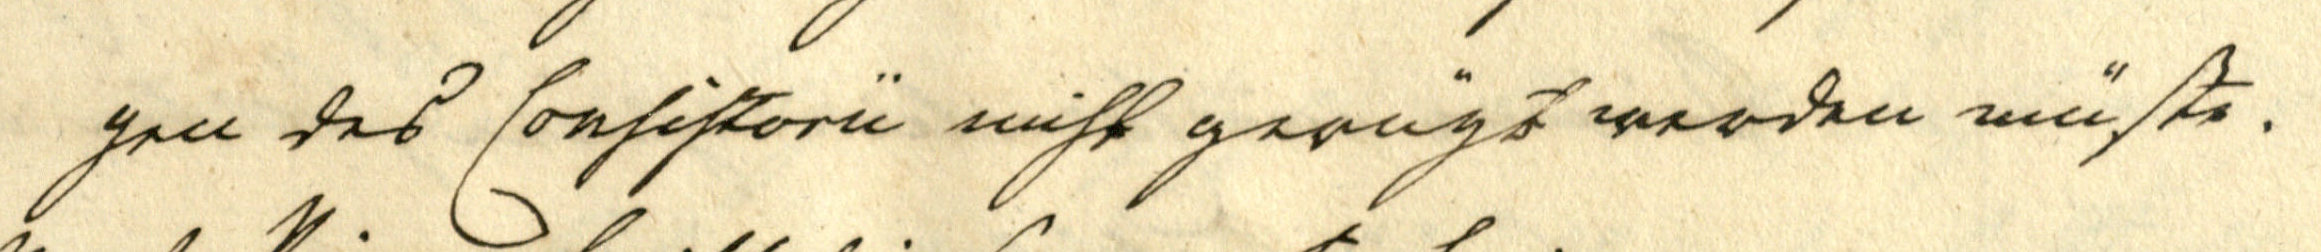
gen des Consistorii nicht gerügt werden müste.
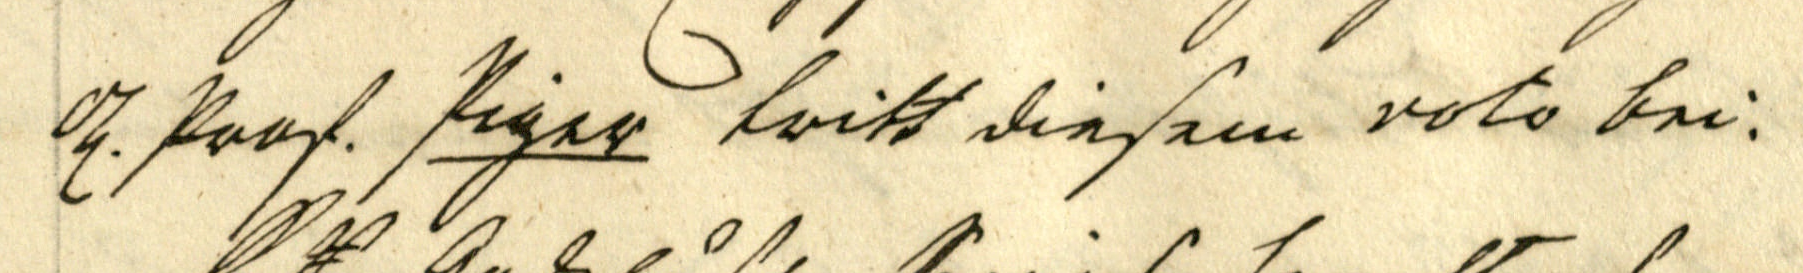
dh. Prof. Piper tritt diesem voto bei.
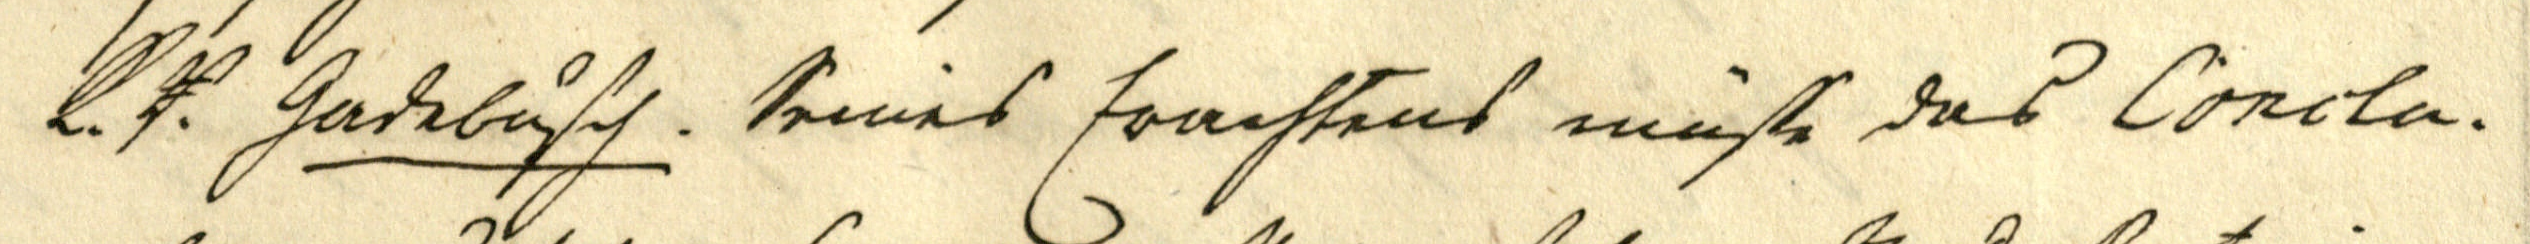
K. R. Gadebusch. Seines Erachtens müsse das Conclu¬
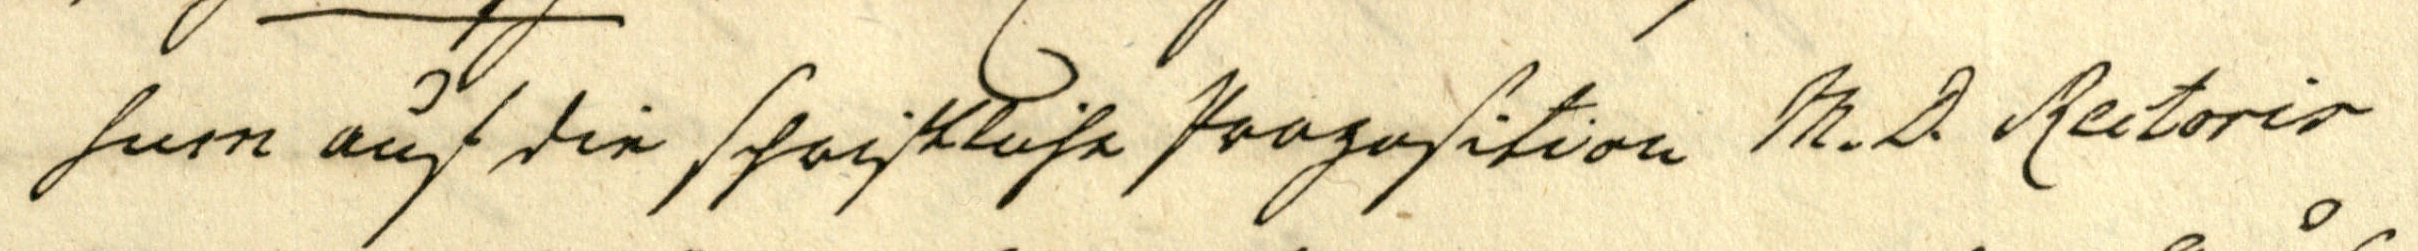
sum auf die schriftliche Proposition M. D. Rectoris
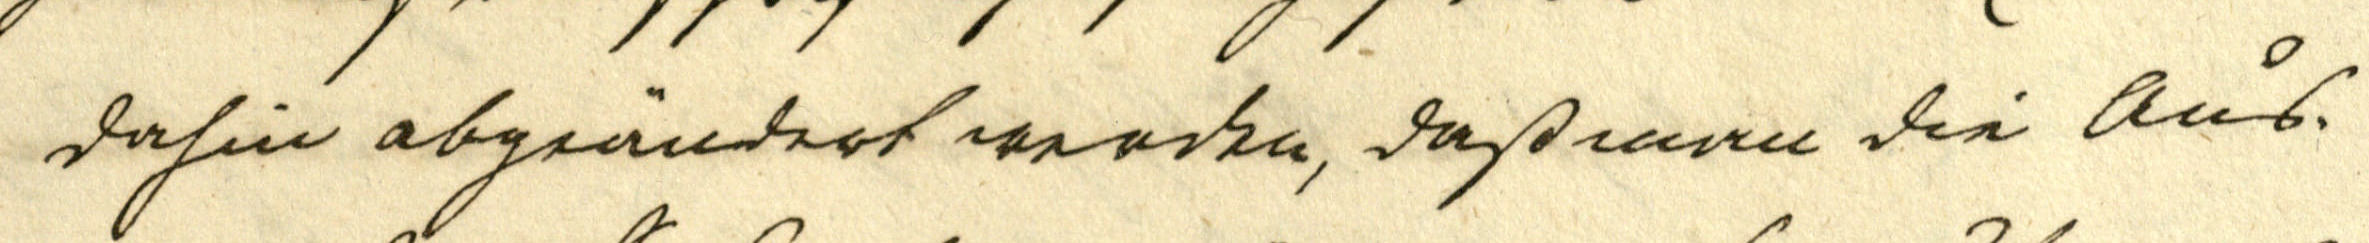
dahin abgeändert werden, daß man die Aus¬
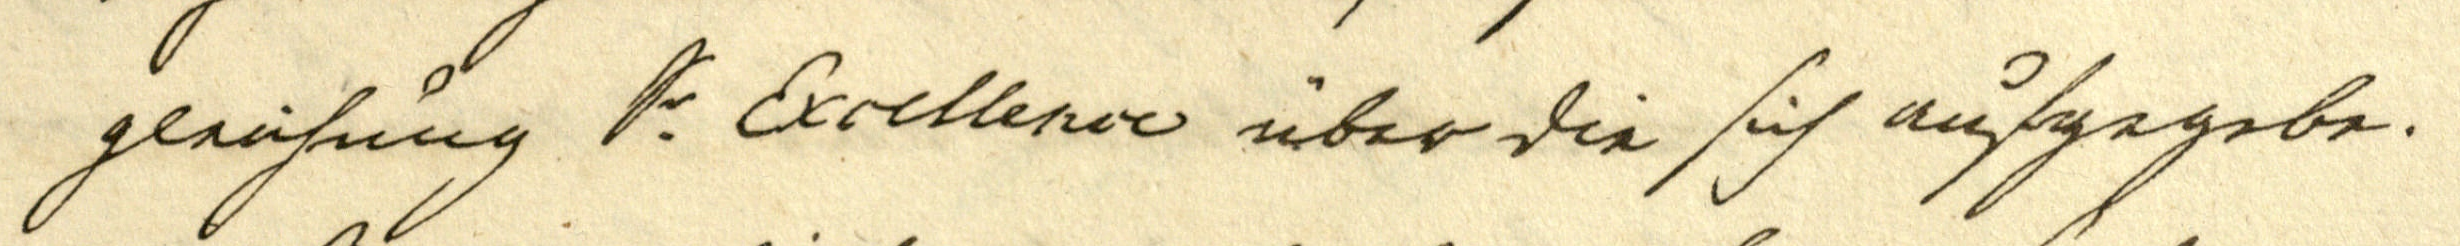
gleichung Sr. Excellence über die sich aufgegebe¬
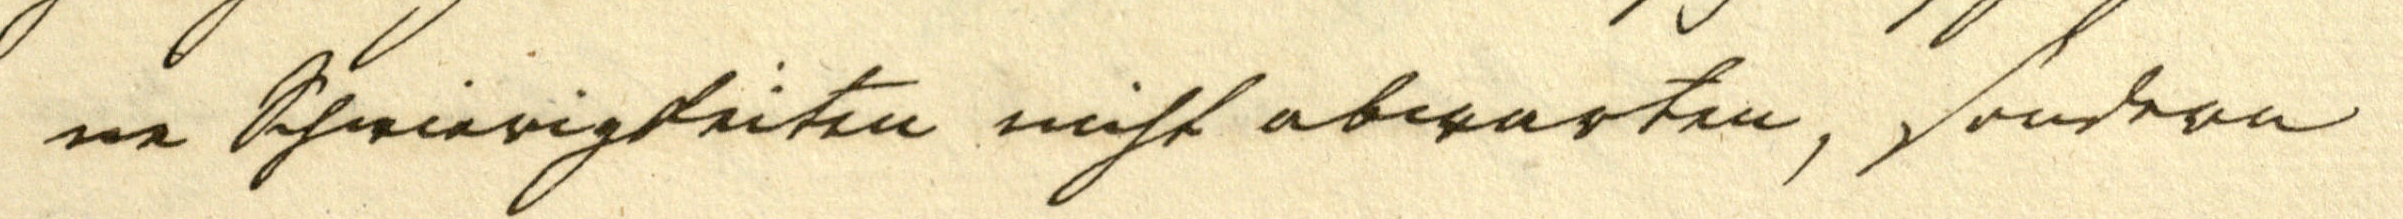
ne Schwierigkeiten nicht abwarten, sondern
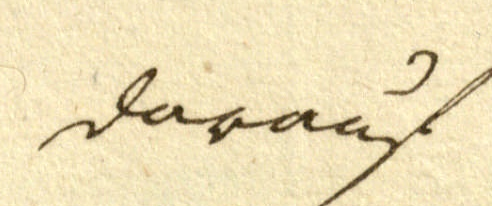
darauf
